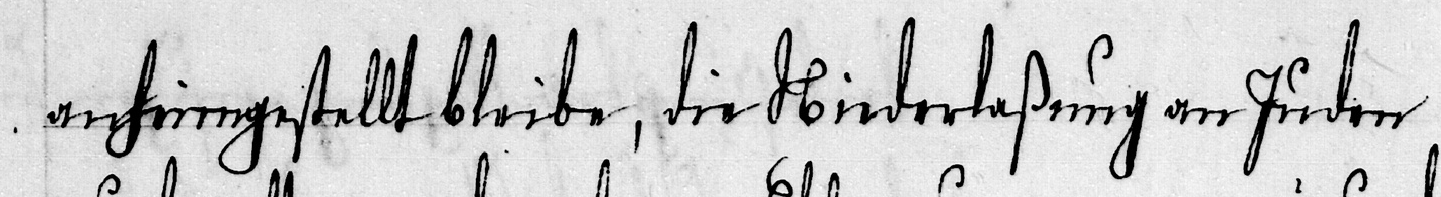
anheimgestellt bleibe, die Niederlaßung an Juden
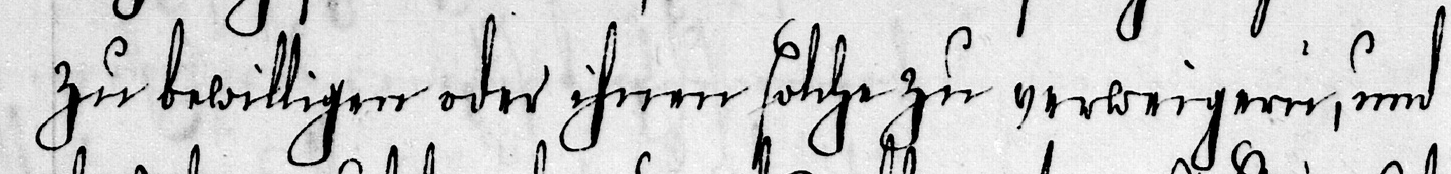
zu bewilligen oder ihnen solche zu verweigern, und
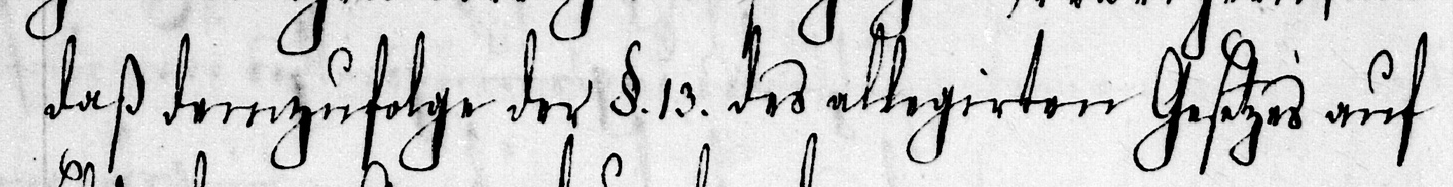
daß demzufolge der §. 13. des allegirten Gesetzes auf
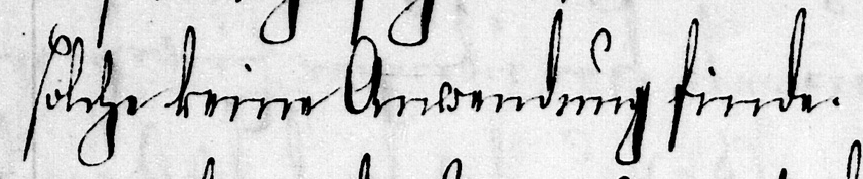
solche keine Anwendung finde.
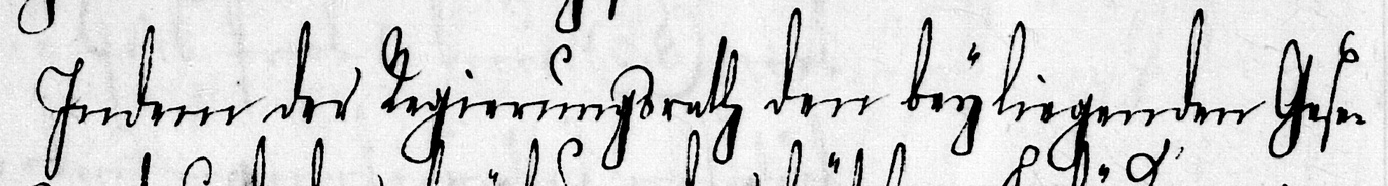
Indem der Regierungsrath den beyliegenden Gese¬
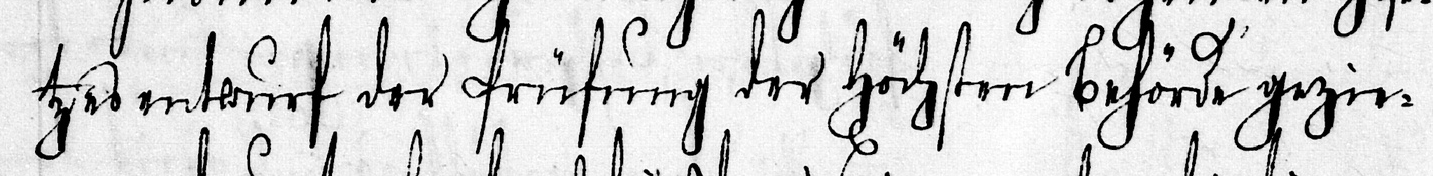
tzesentwurf der Prüfung der höchsten Behörde gezie¬
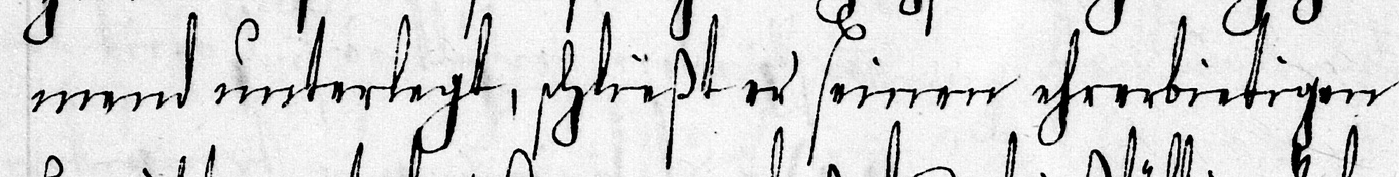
mend unterlegt, schließt er seinen ehrerbietigen
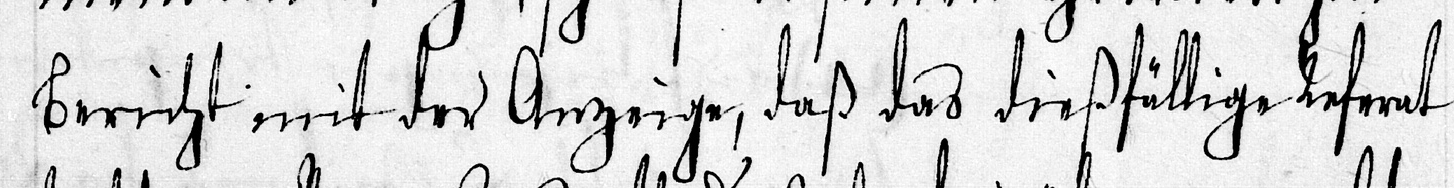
Bericht mit der Anzeige, daß das dießfällige Refer¬
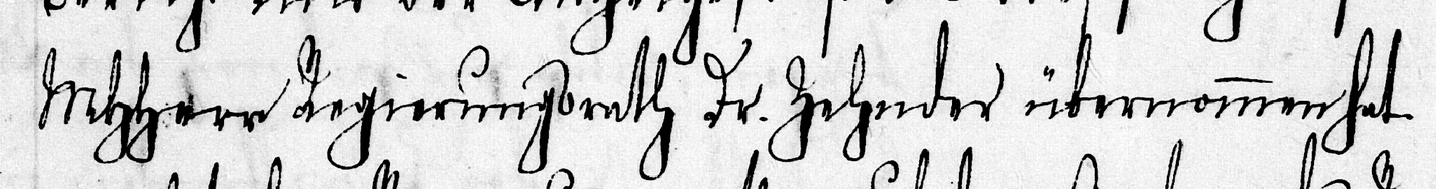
MHHerr Regierungsrath Fr. Zehnder übernommen hat.
